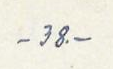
38
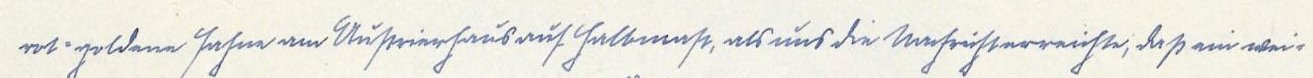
rot-goldene Fahnen am Austrierhaus auf Halbmast, als uns die Nachricht erreichte das einen wei-
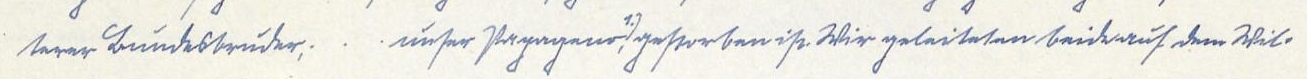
terer Bundesbruder … unser Papageno gestorben ist. Wir geleiteten beide auf dem Wil-
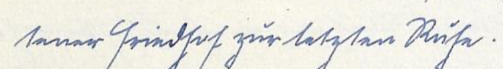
tener Friedhof zur letzten Ruhe.
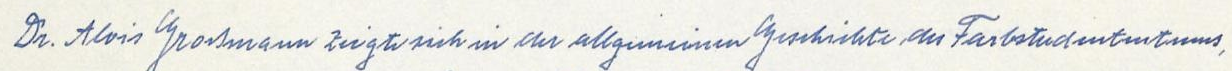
Dr. Alois Großmann zeigte sich in der allgemeinen Geschichte des Farbstudententums
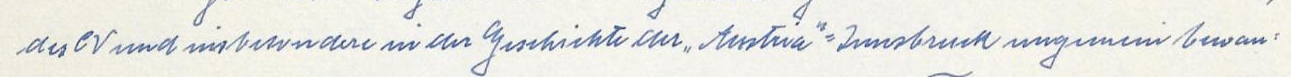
des CV und insbesondere in der Geschichte der „Austria“-Innsbruck ungemein bewan-
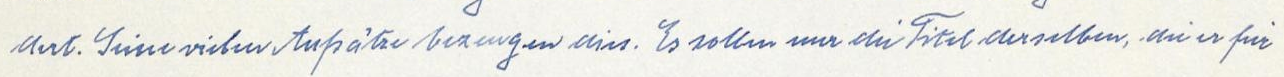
dert. Seine vielen Aufsätze bezeugen dies. Es soll nur die Titel derselben, die er für
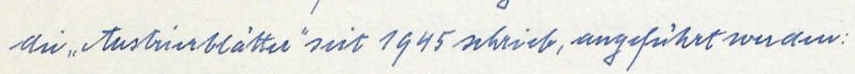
die „Austriablätter“ seit 1945 schrieb, angeführt werden:
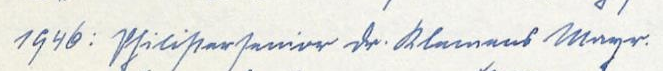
1946: Philistersenior Dr. Clemens Mayer
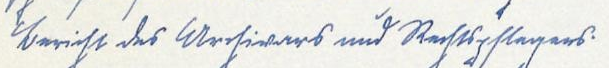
Bericht des Archivars und Rechtspflegers
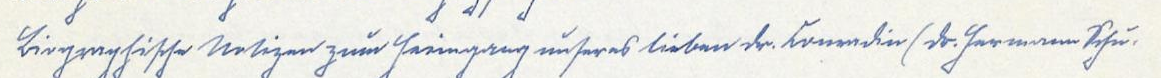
Biografische Notizen zum Heimgang unseres lieben Dr. Conradin (Dr. Hermann Schu-
